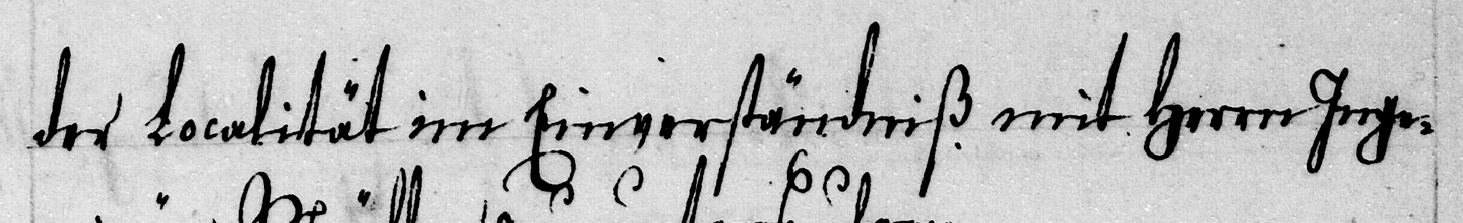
der Localität im Einverständniß mit Herrn Inge¬
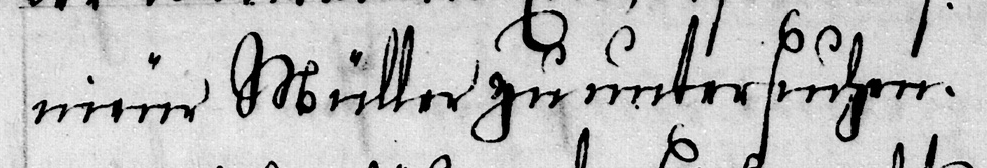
nieur Müller zu untersuchen.
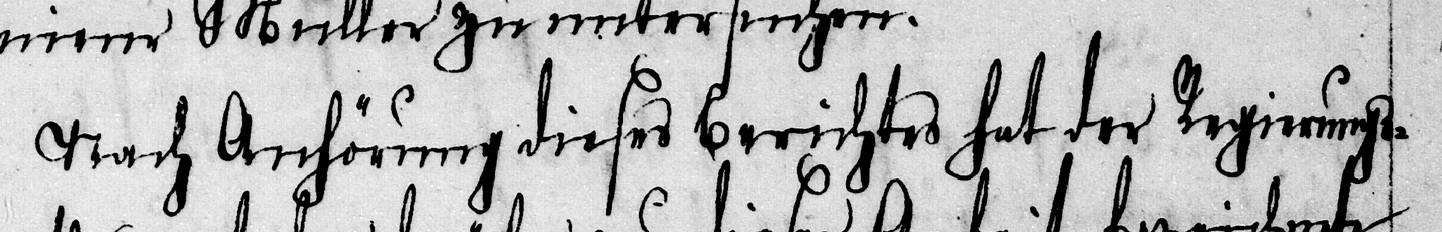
Nach Anhörung dieses Berichtes hat der Regierungs¬
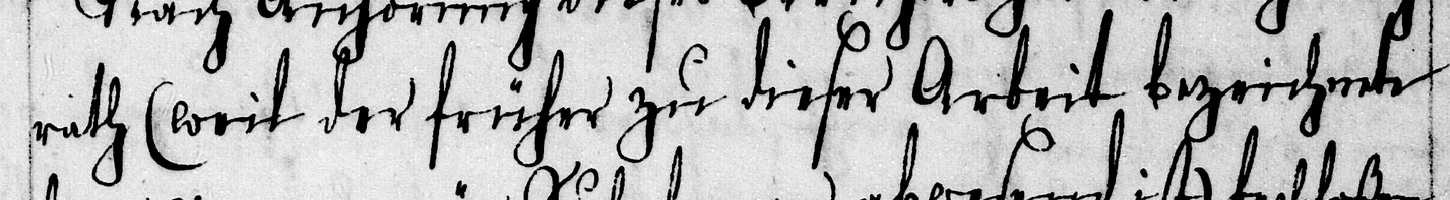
rath (weil der früher zu dieser Arbeit bezeichnete
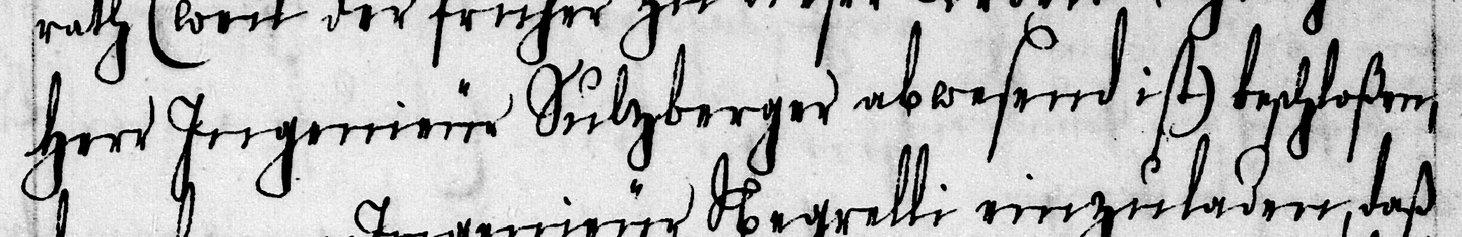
Herr Ingenieur Sulzberger abwesend ist) beschloßen,
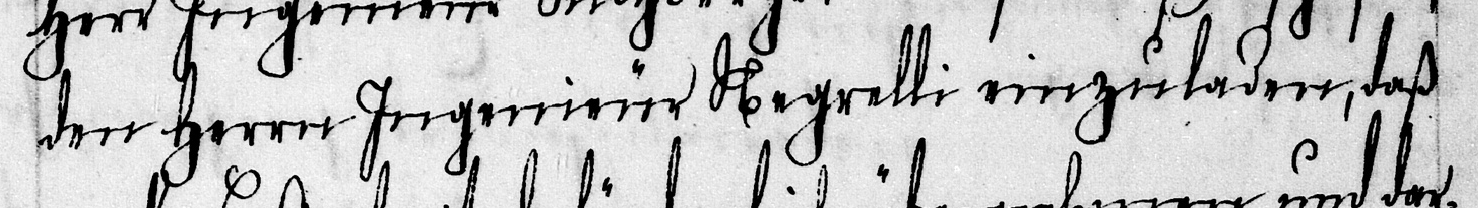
den Herrn Ingenieur Negrelli einzuladen, daß
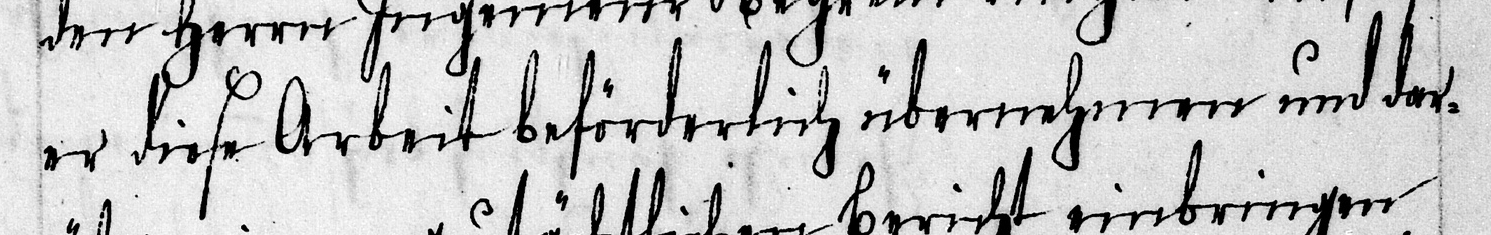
er diese Arbeit beförderlich übernehmen und dar¬
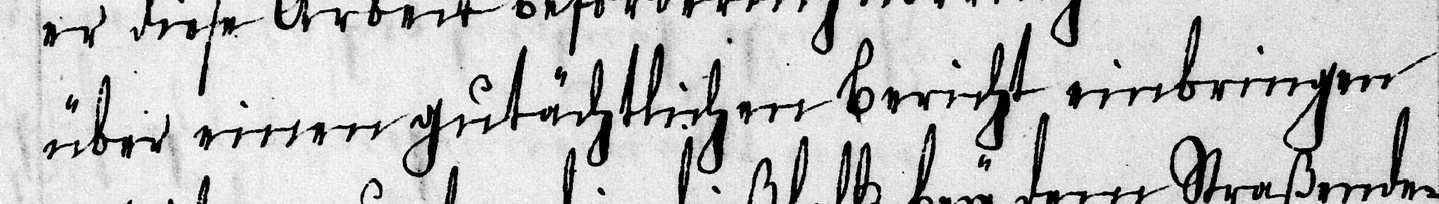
über einen gutächtlichen Bericht einbringen
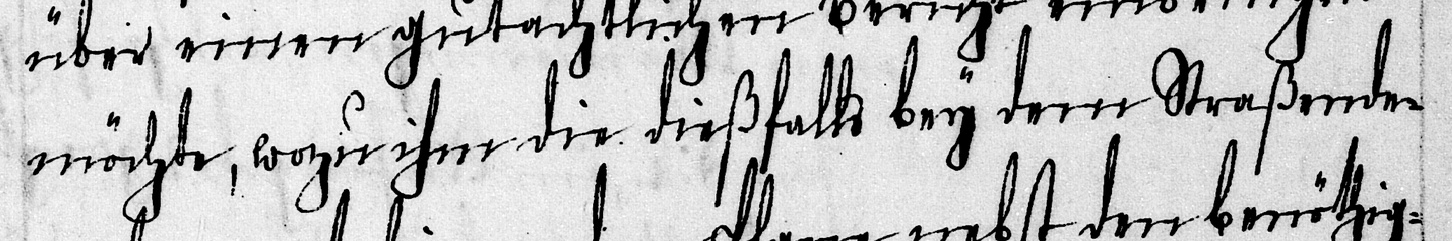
möchte, wozu ihm die dießfalls bey dem Straßende¬
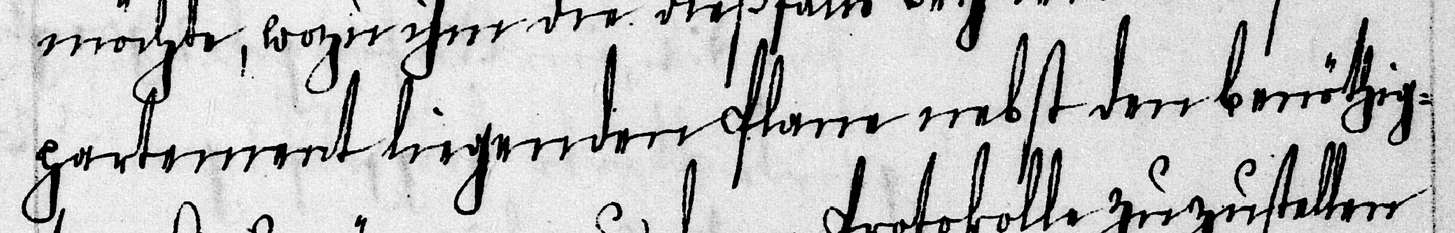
partement liegenden Plane nebst den benöthig¬
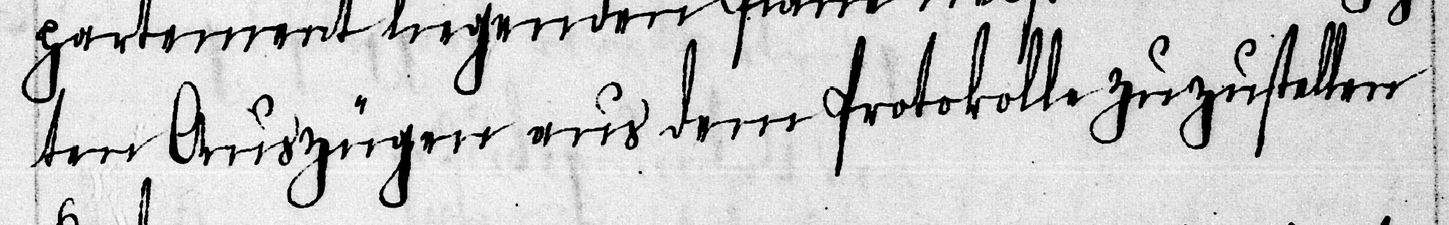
ten Auszügen aus dem Protokolle zuzustellen
